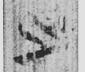之
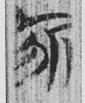所
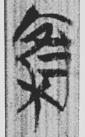{宀集}（集）
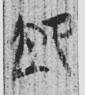䇃（竢）
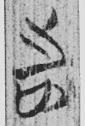𠱾（時）
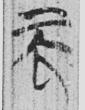而
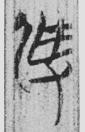{尸拃}
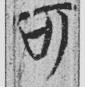可
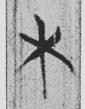木
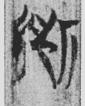斯
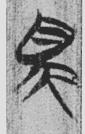蜀（獨）
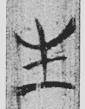生
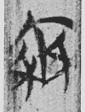秦（榛）
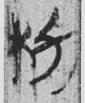朸
